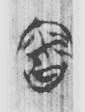審
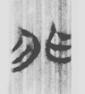非
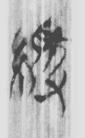緩
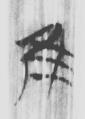隹
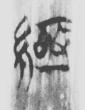{糸亟}
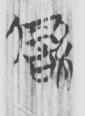{人言系}
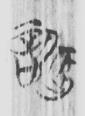誳
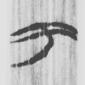于
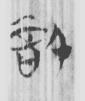信
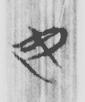母
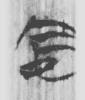{宀𠁩}
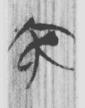夭
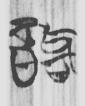詒
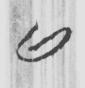㠯（以）
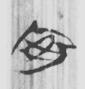安
